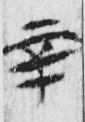辛
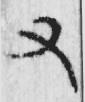又
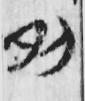○（間）
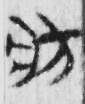病
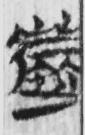速
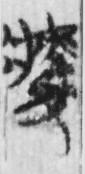○（瘥）
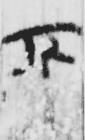不
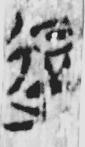逗
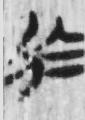於
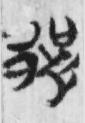○（枝）
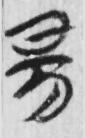昜（陽）
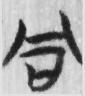同
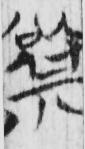○（敓）
